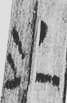之
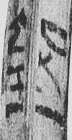{六又土}（窟）
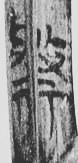祭
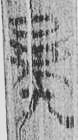員
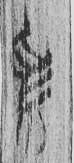○（奚）
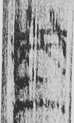○（吾）
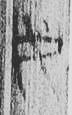女（如）
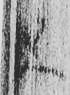之
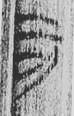可（何）
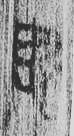思（使）
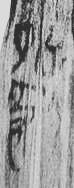○（飽）
